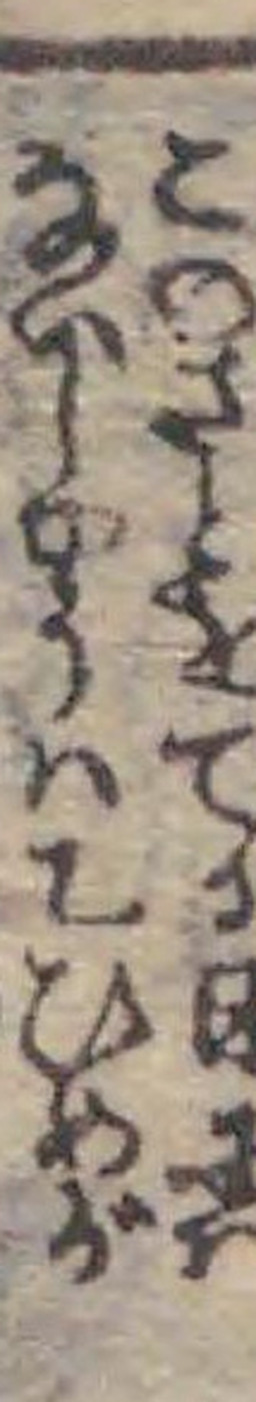ないしやうは乙ひめが
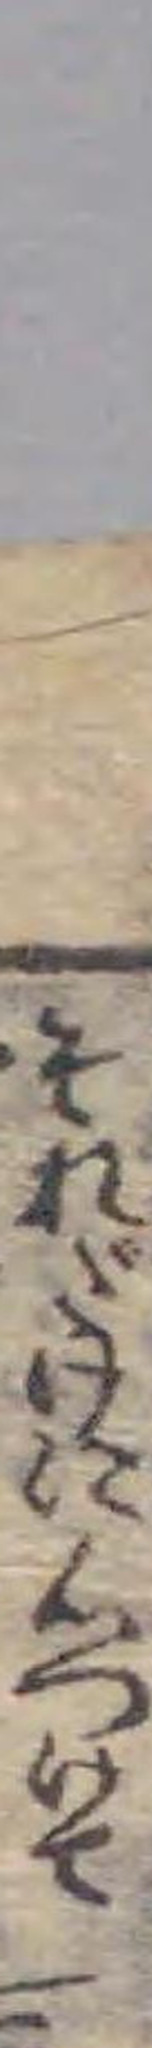それだけに心つけて
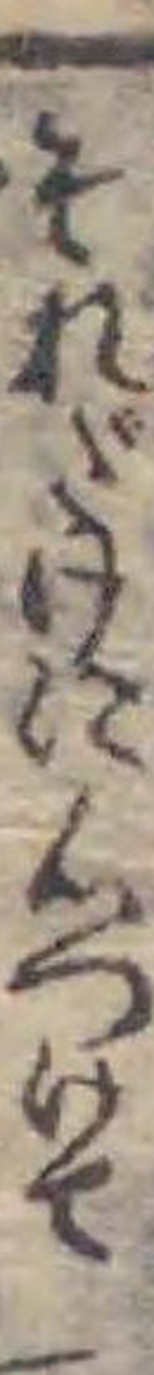それだけに心つけて
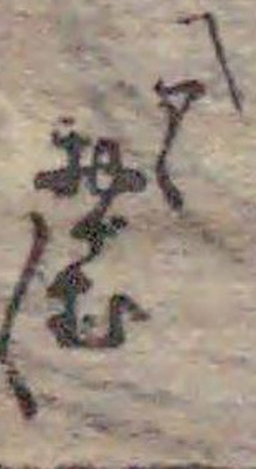おがむ
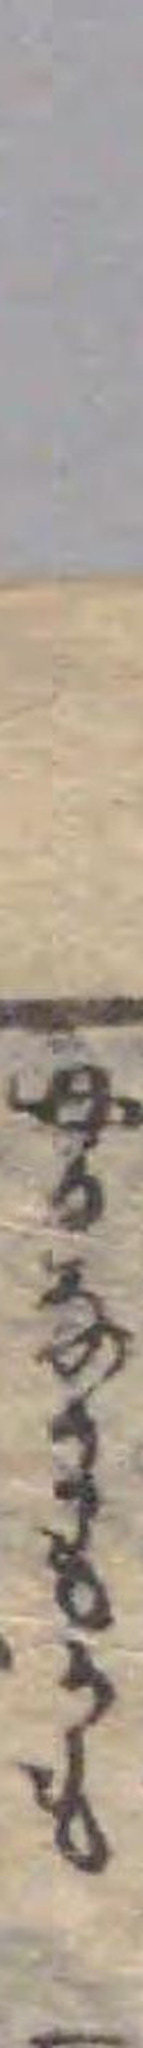やるなにもかも
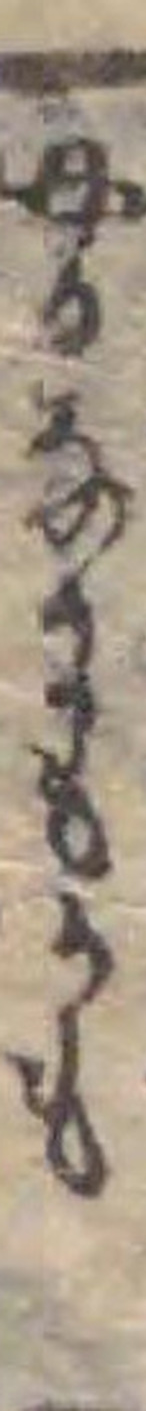やるなにもかも
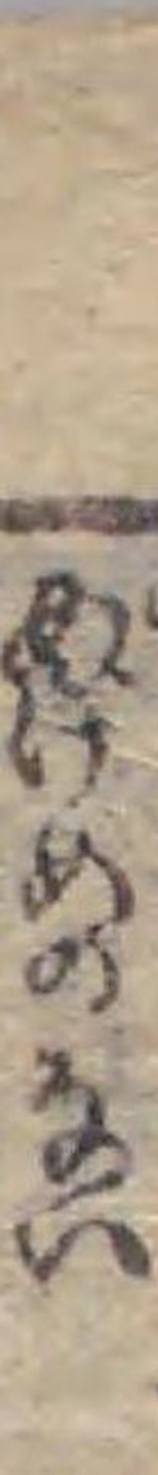ぬけめのない
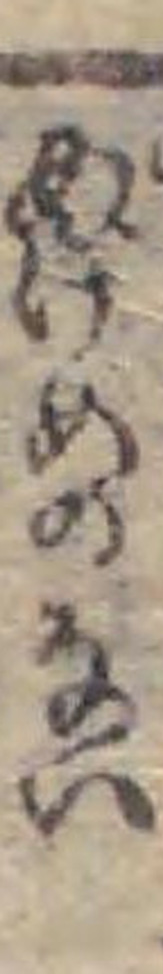ぬけめのない
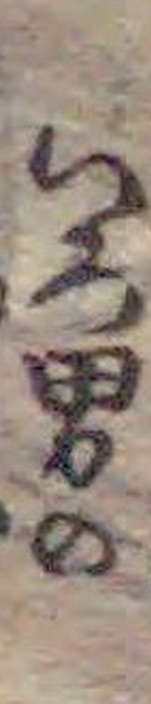いろ男の
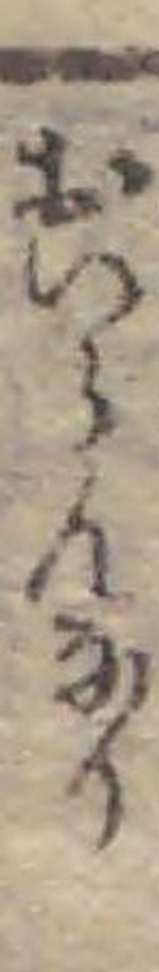おいらんなり
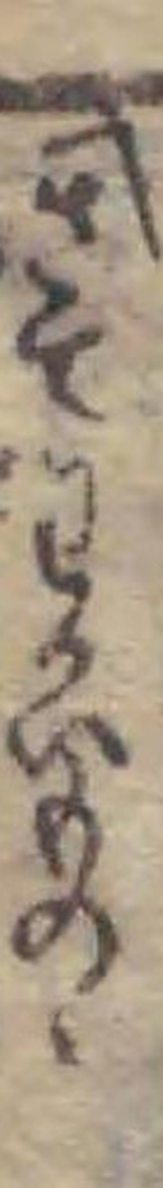〽さてわかいものゝ
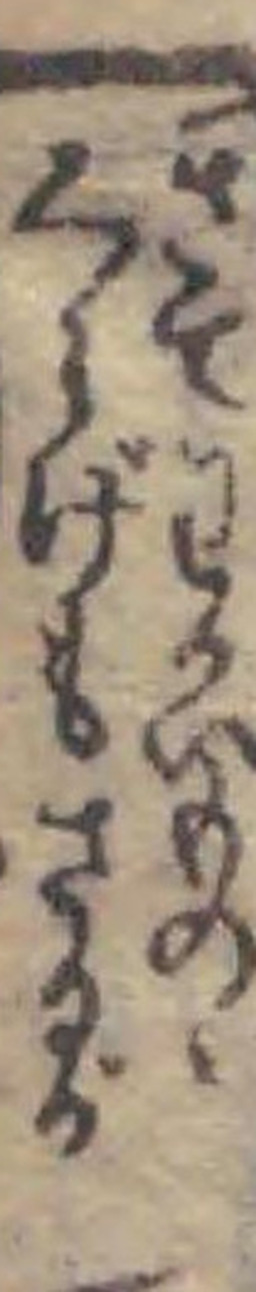くらげもさるが
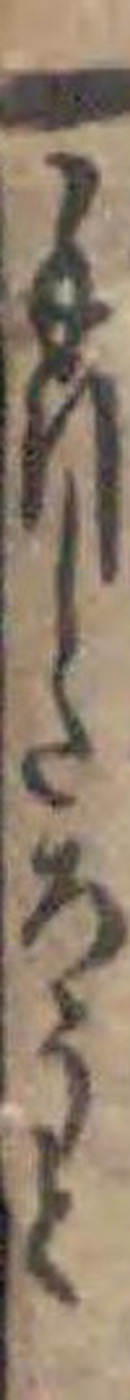手引したろうと

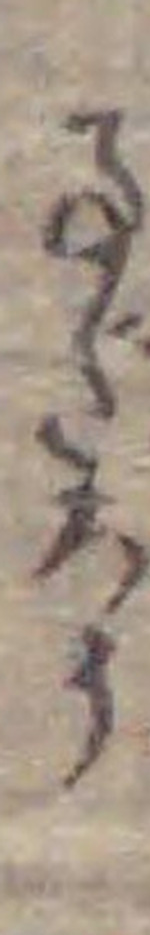事だろう
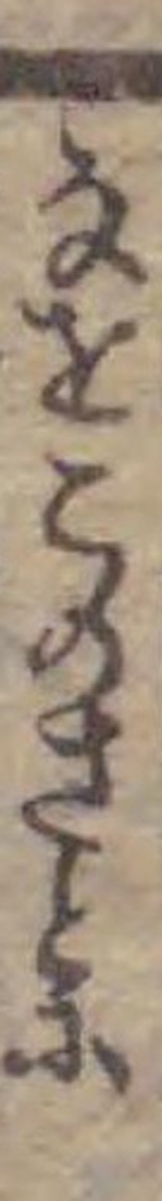なをこのさとに
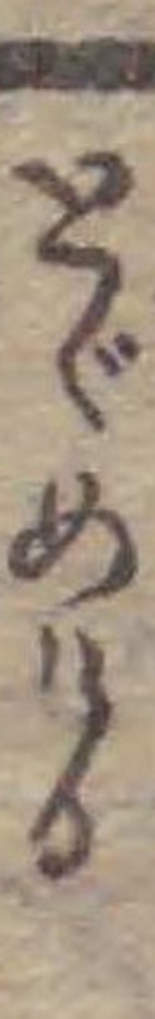とゞめける
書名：竜宮苦界玉手箱 : 3巻
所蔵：国立国会図書館 National Diet Library, JAPAN
